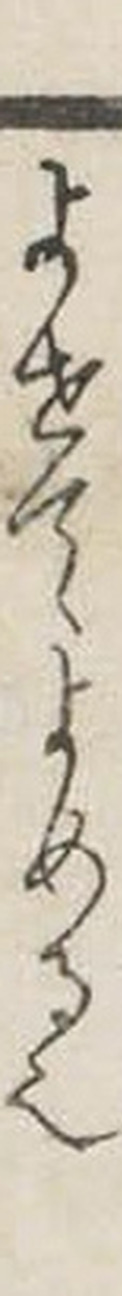よせてよめる也

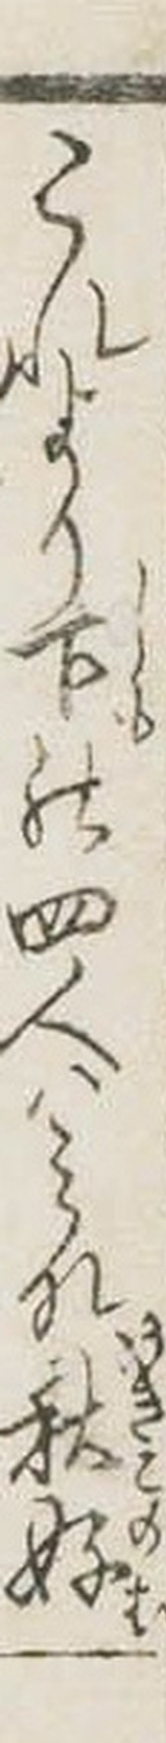これより下の四人はみな秋好
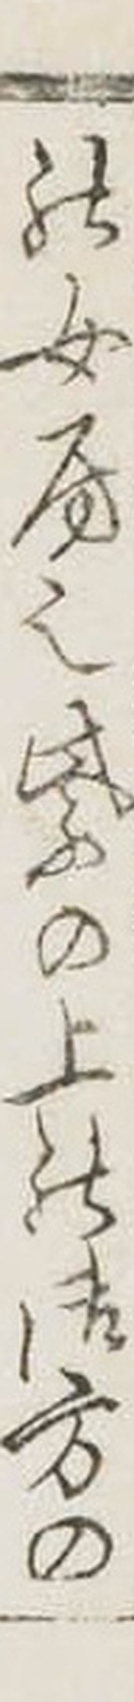の女房也紫の上の御方の
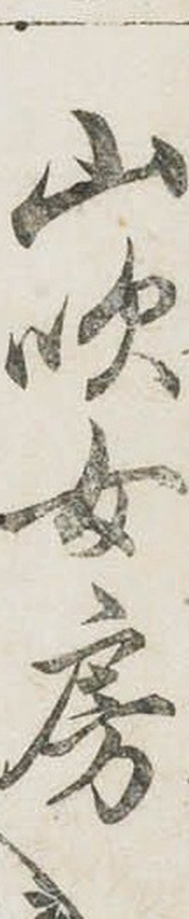山吹女房
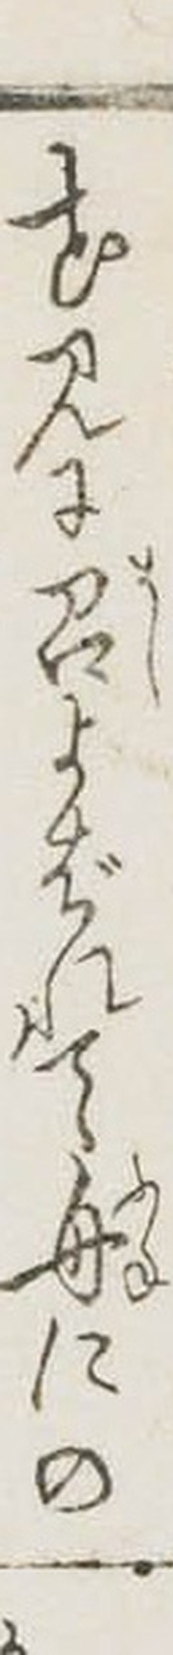花見に召よばれて舟にの
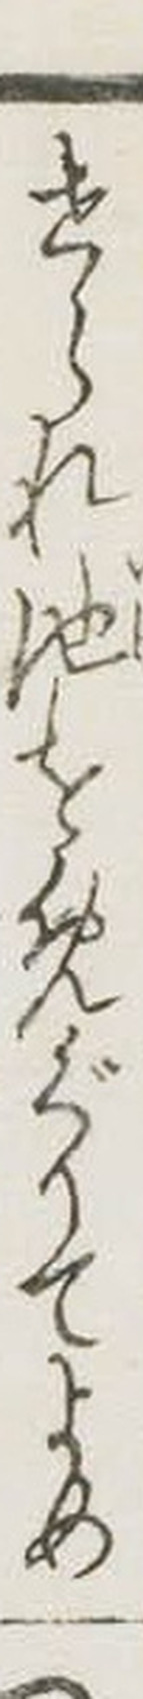せられ池をめぐりてよめ
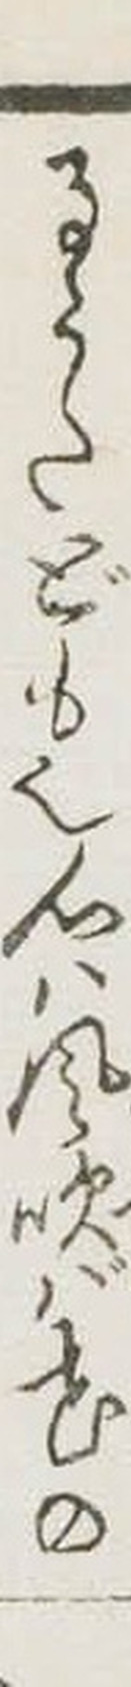るうたども也心は風吹ば花の
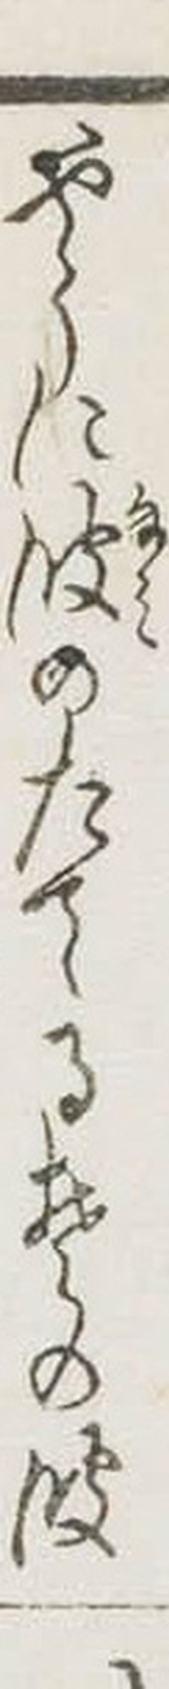やうに波のたてるその波
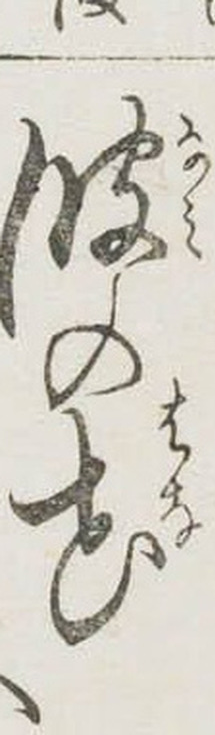波の花
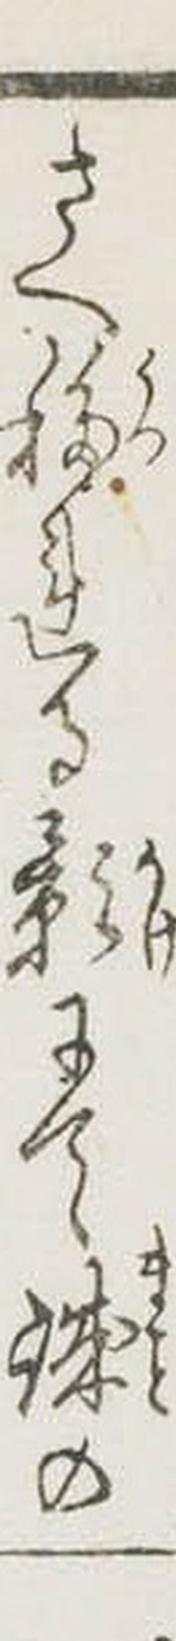さへ移れる影にて誠の
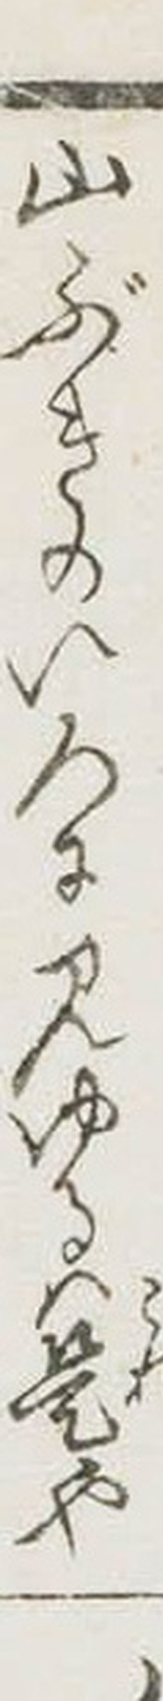山ぶきのいろに見ゆるは是や
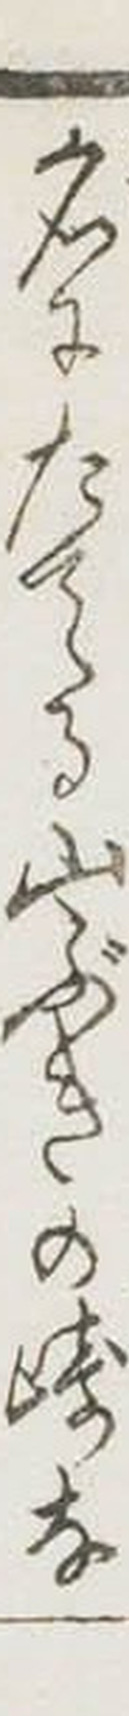名にたてる山ぶきの崎な
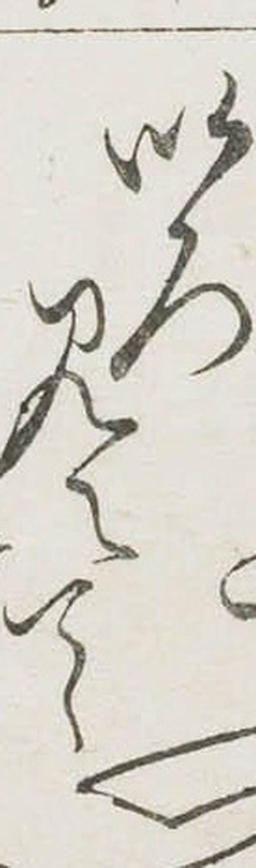見えて
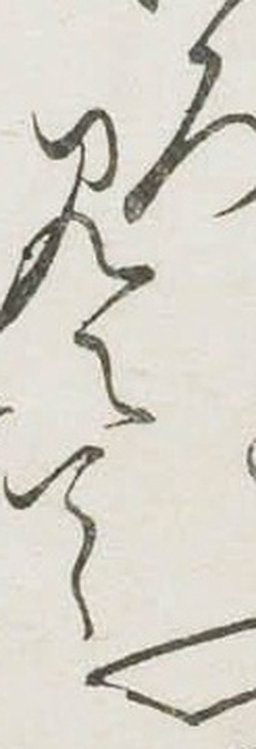見えて
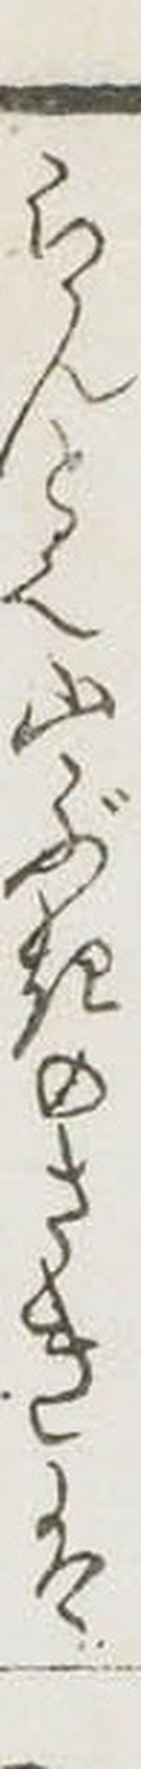らんと也山ぶきのさきは
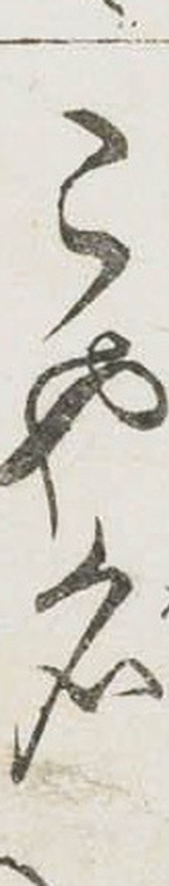こや名
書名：源氏百人一首
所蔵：東京学芸大学教育コンテンツアーカイブ
